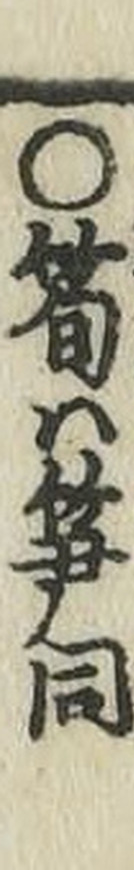○筍は笋同
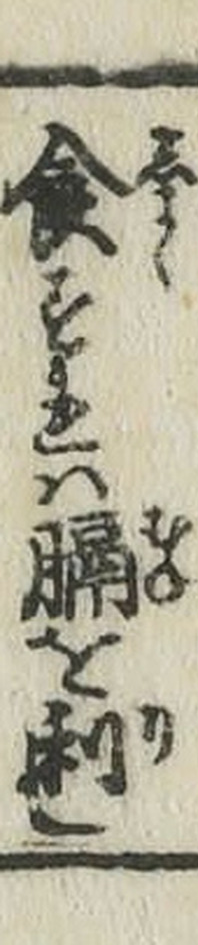食すれは膈を利し
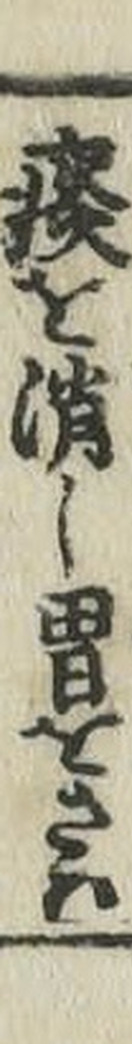痰を消し胃をさは
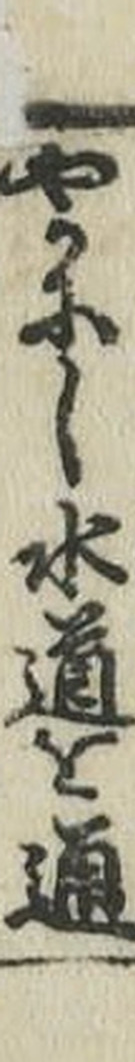やかにし水道を通

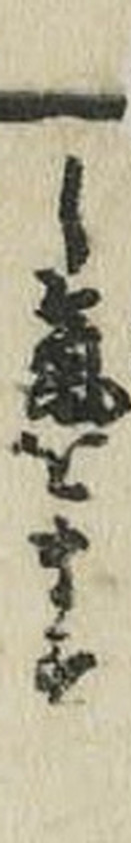し気をます
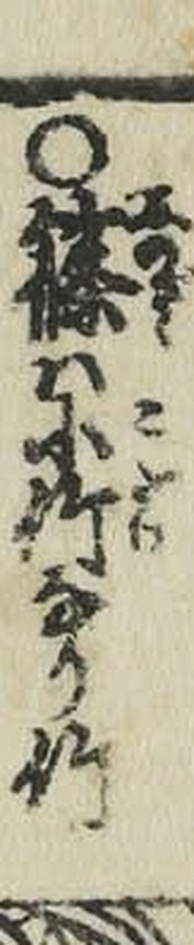○篠は小竹なり竹
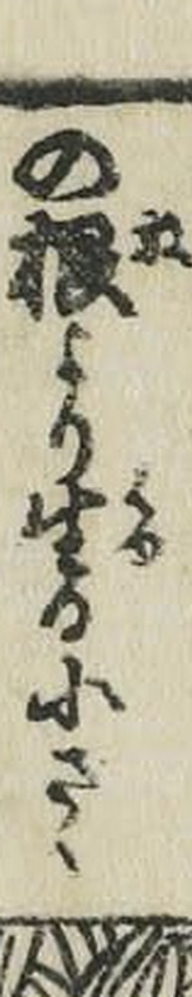の根より生る小さゝ
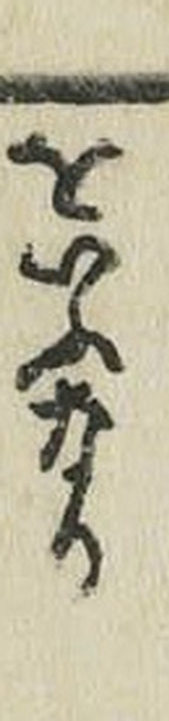をいふなり
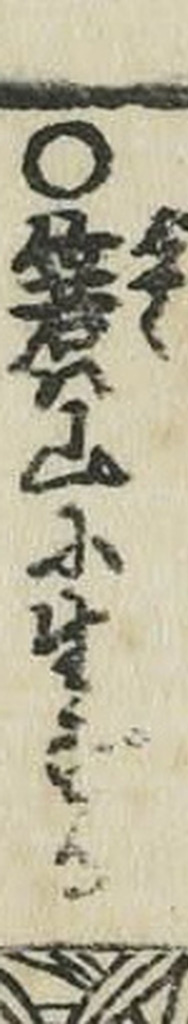○箬は山に生ずる
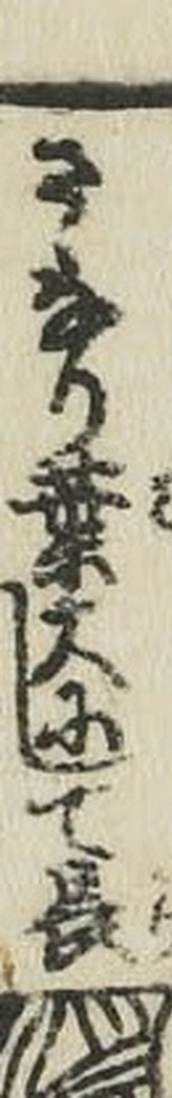さゝなり葉大にして長
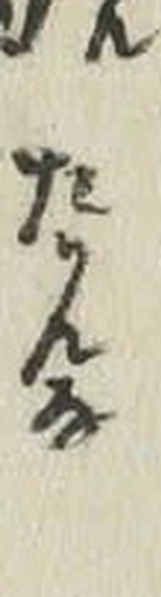たかんな
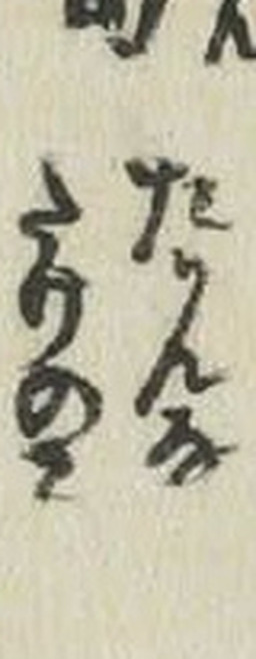たけのこ
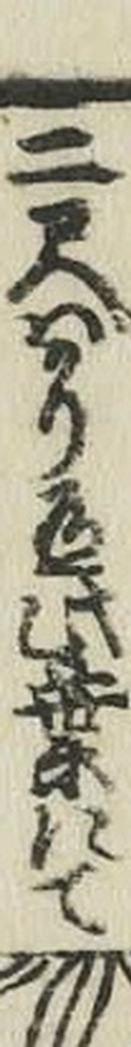二尺ばかり有此葉にて
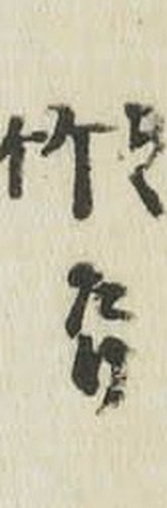竹たけ
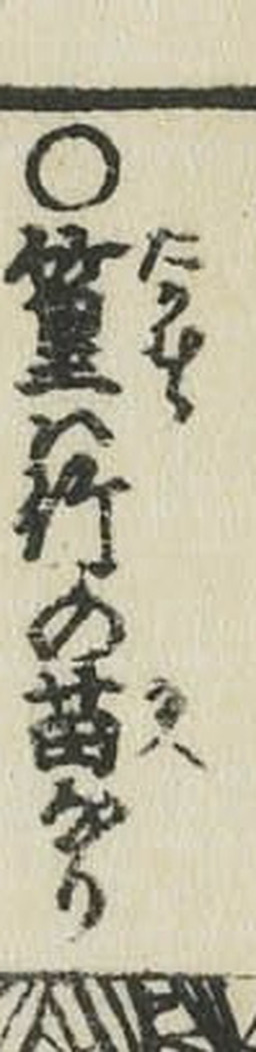○篁は竹の苗なり
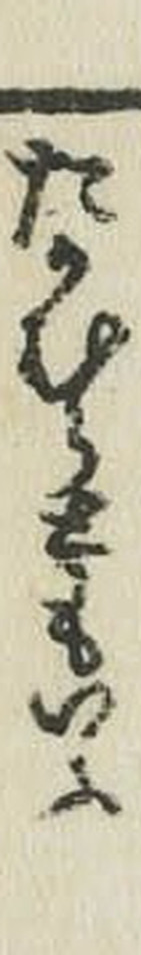たかむらともいふ
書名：増補頭書訓蒙図彙大成 10巻 8:巻之17-19
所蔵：東京学芸大学教育コンテンツアーカイブ
